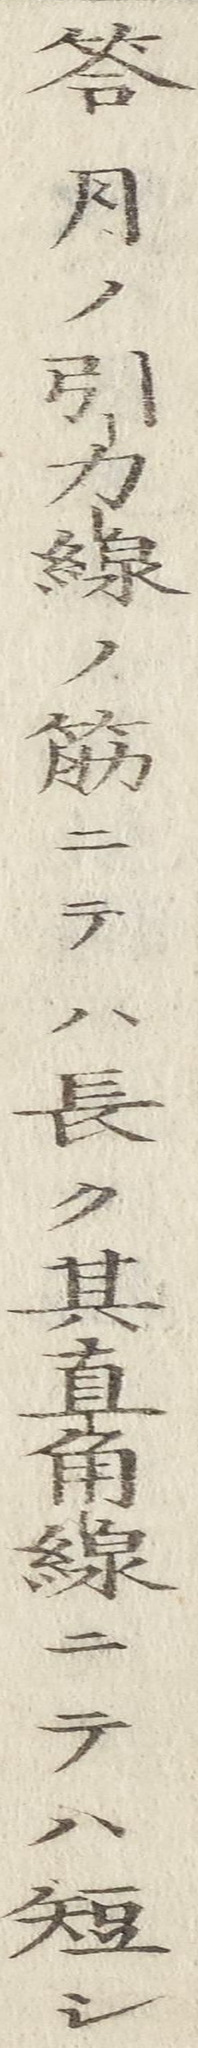答月ノ引力線ノ筋ニテハ長ク其直-角-線ニテハ短シ
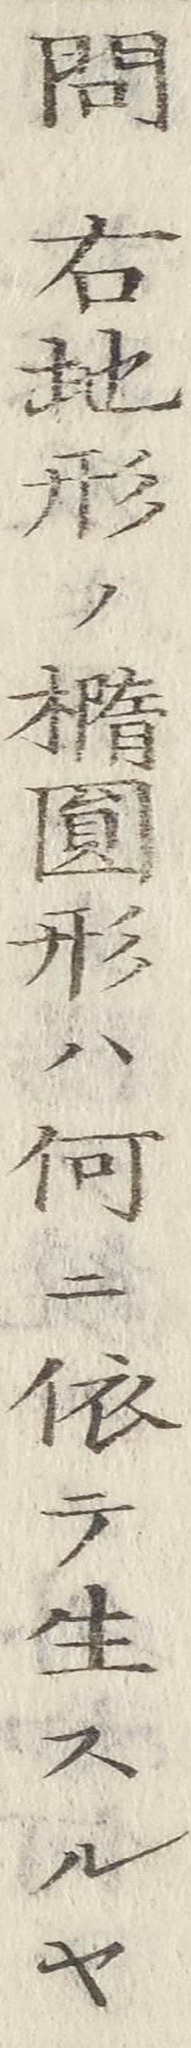問右地形ノ楕円形ハ何ニ依テ生スルヤ
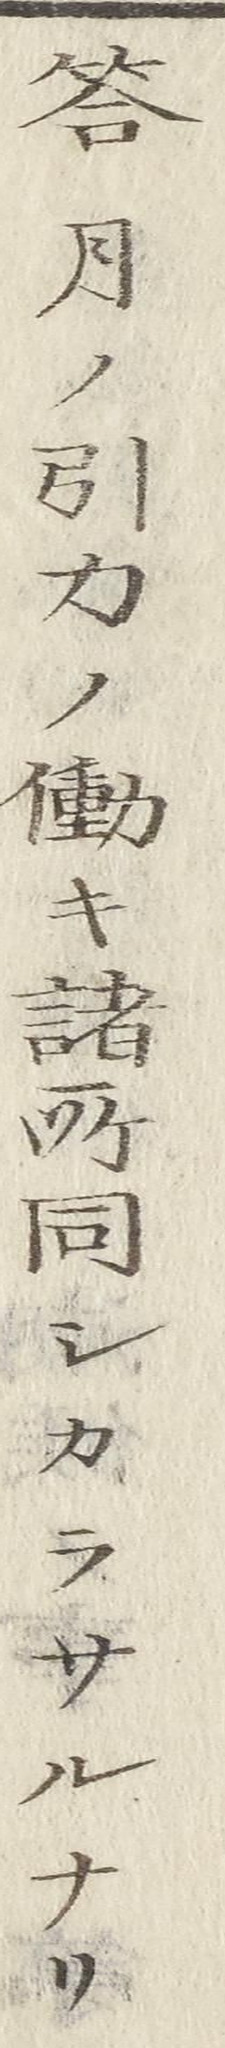答月ノ引力ノ働キ諸所同シカラサルナリ
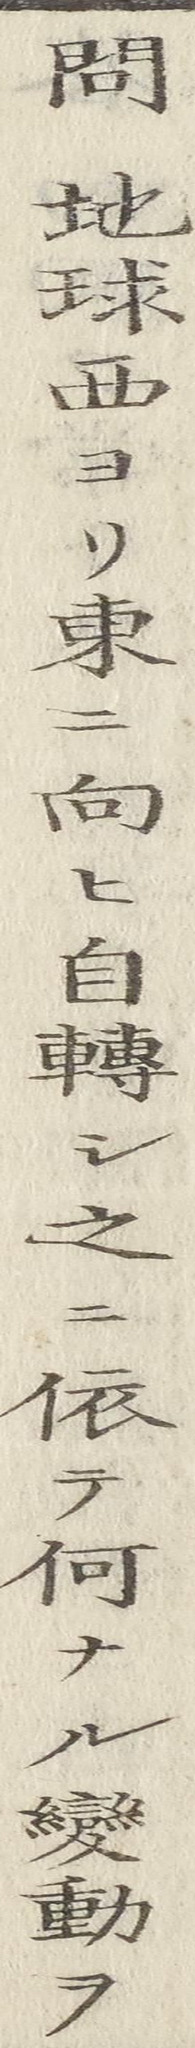問地球西ヨリ東ニ向ヒ自転シ之ニ依テ何ナル変動ヲ
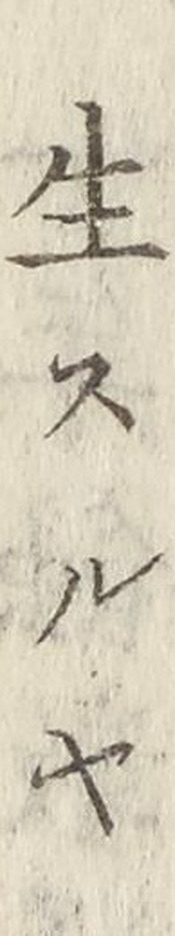生スルヤ
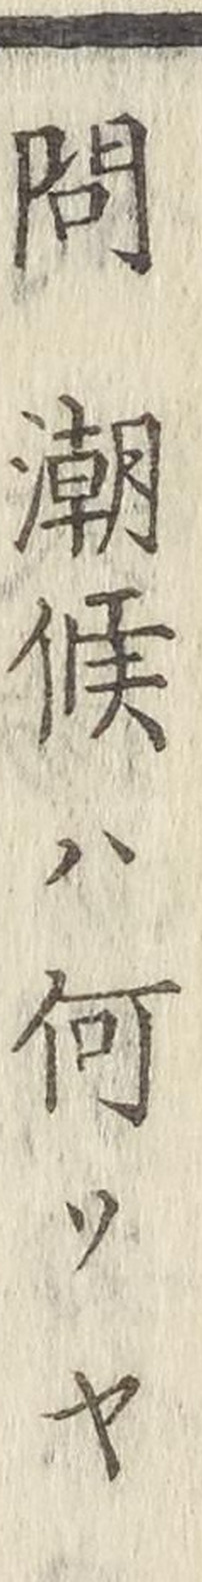問潮候ハ何ソヤ
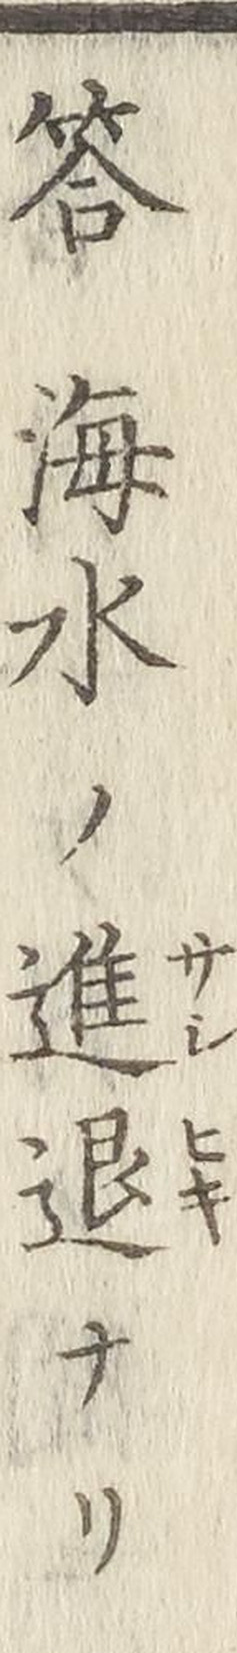答海水ノ進退ナリ
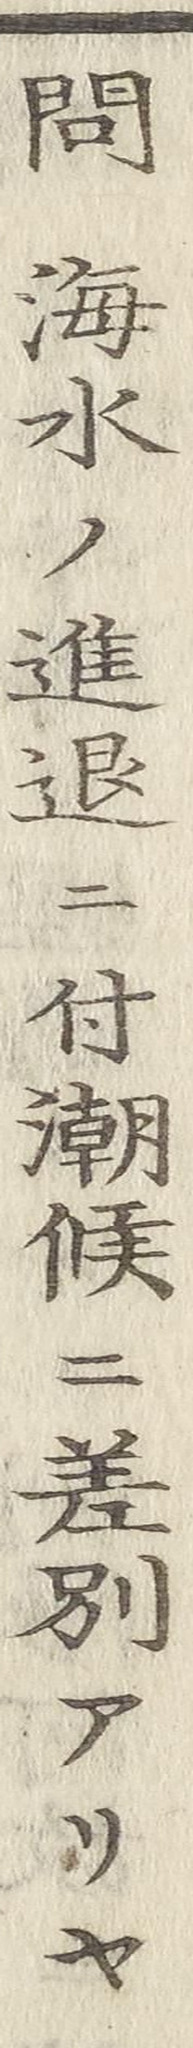問海水ノ進退ニ付潮候ニ差別アリヤ
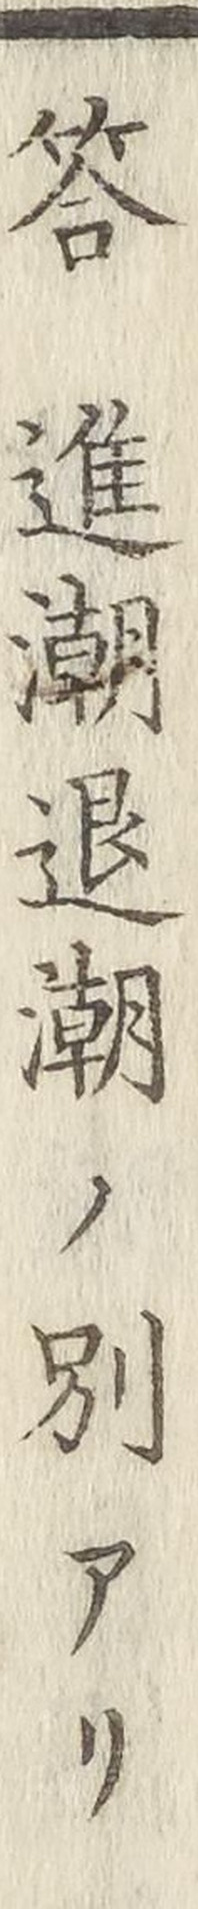答進潮退潮ノ別アリ
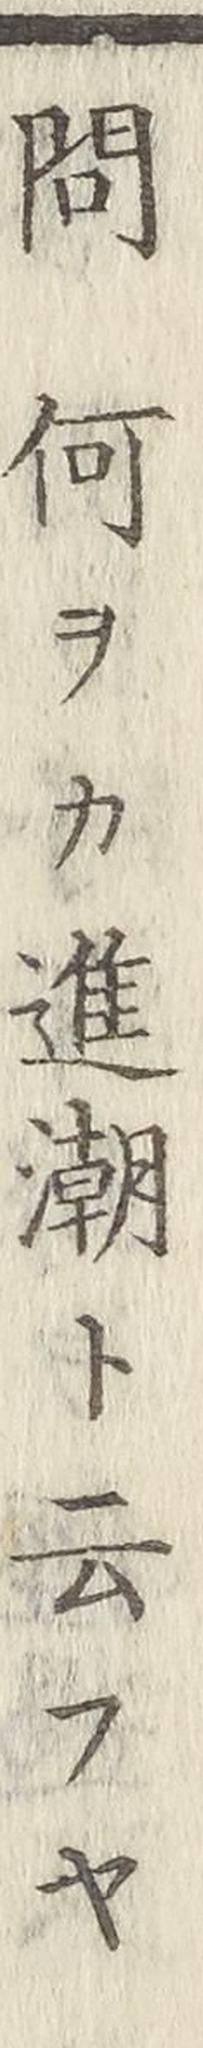問何ヲカ進潮ト云フヤ
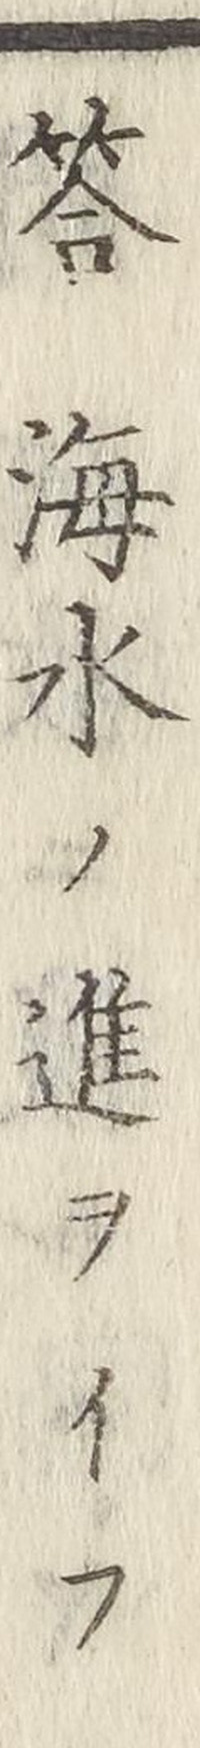答海水ノ進ヲイフ
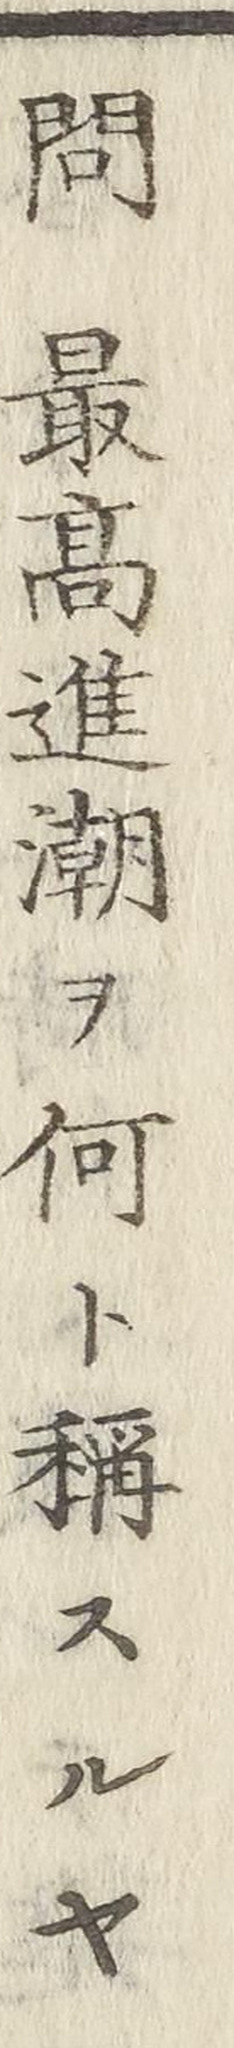問最高進潮ヲ何ト称スルヤ
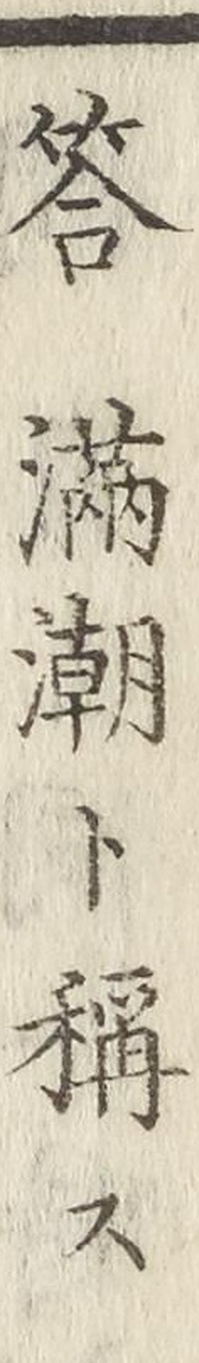答満潮ト称ス
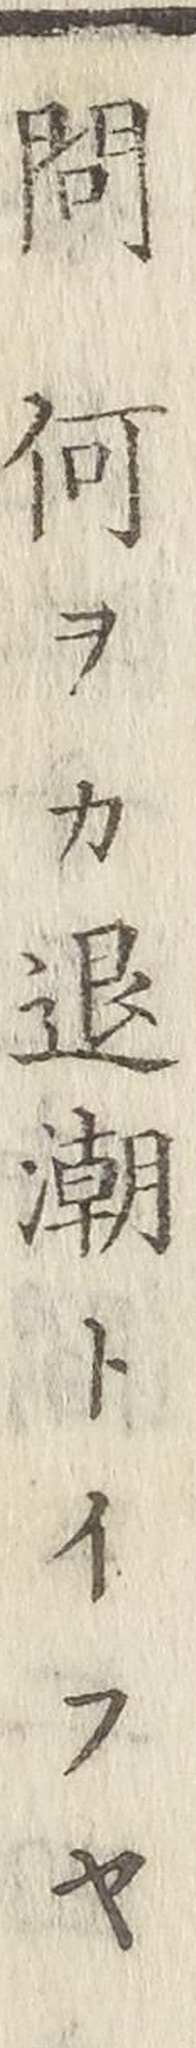問何ヲカ退潮トイフヤ
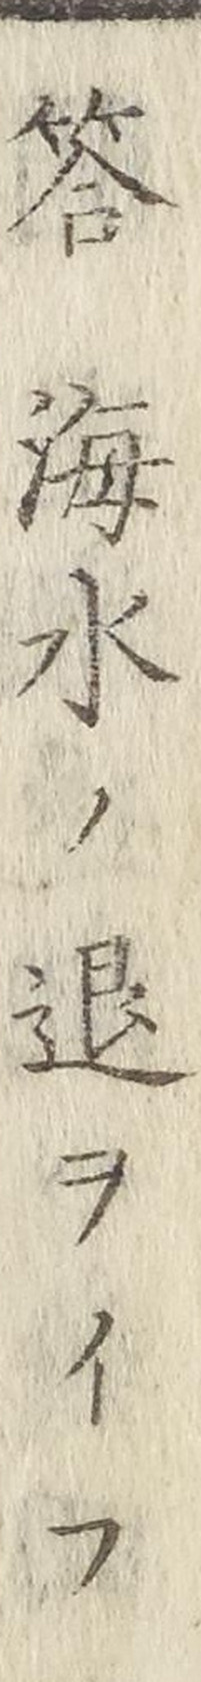答海水ノ退ヲイフ

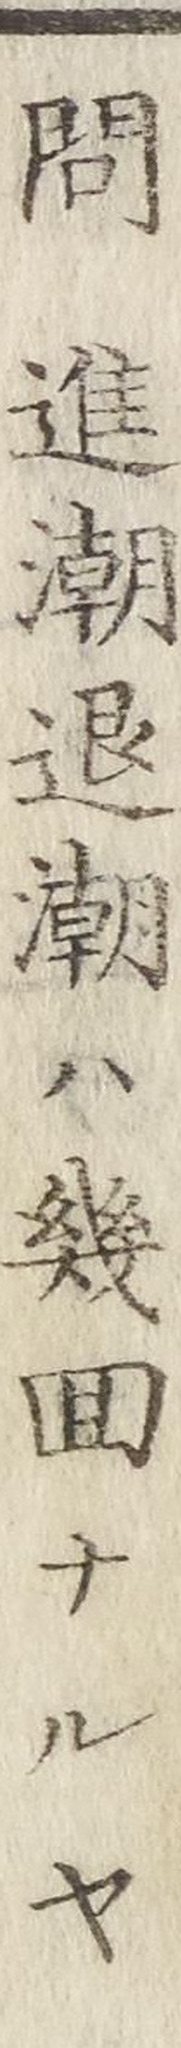問進潮退潮ハ幾回ナルヤ
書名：星学圖説　下
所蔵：東京大学地震研究所図書室 Earthquake Research Institute Library, The University of Tokyo, JAPAN
